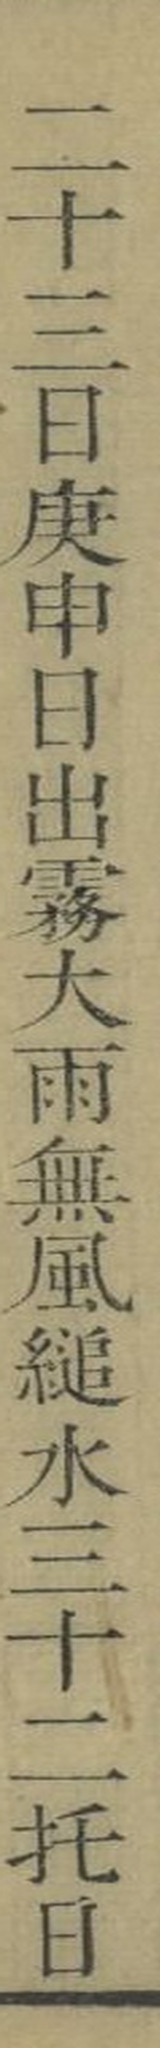二十三日庚申日出霧大雨無風縋水三十二托日
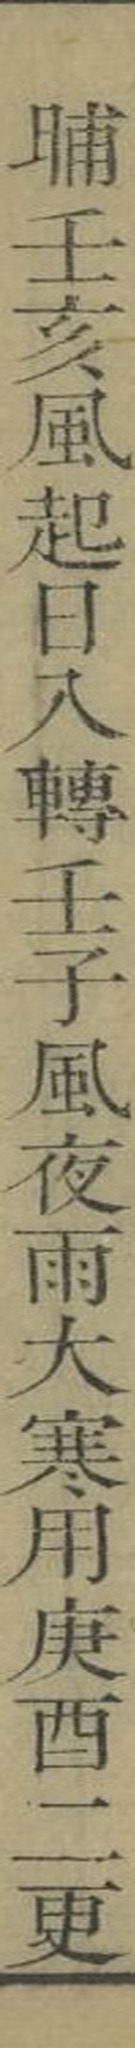晡壬亥風起日入轉壬子風夜雨大寒用庚酉二更
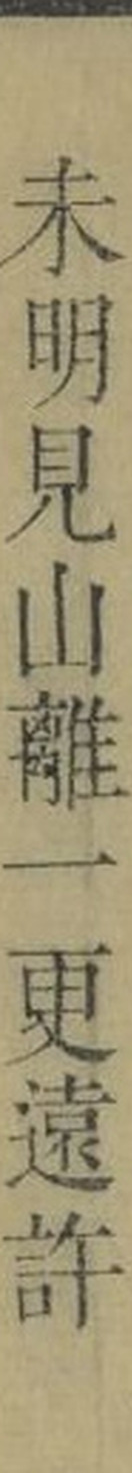未明見山離一更遠許
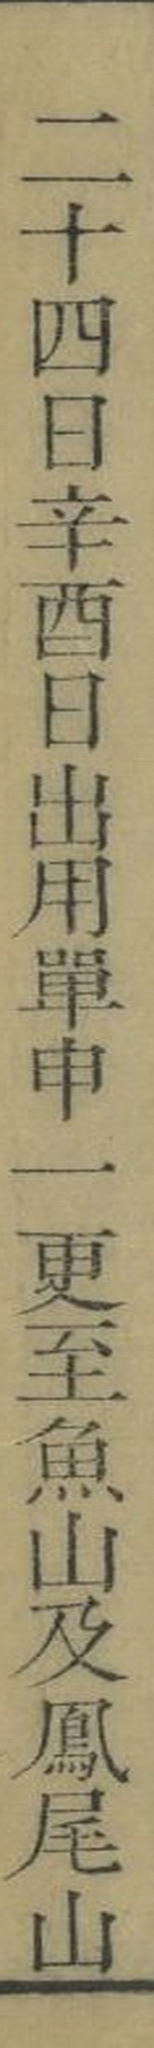二十四日辛酉日出用單申一更至魚山及鳳尾山

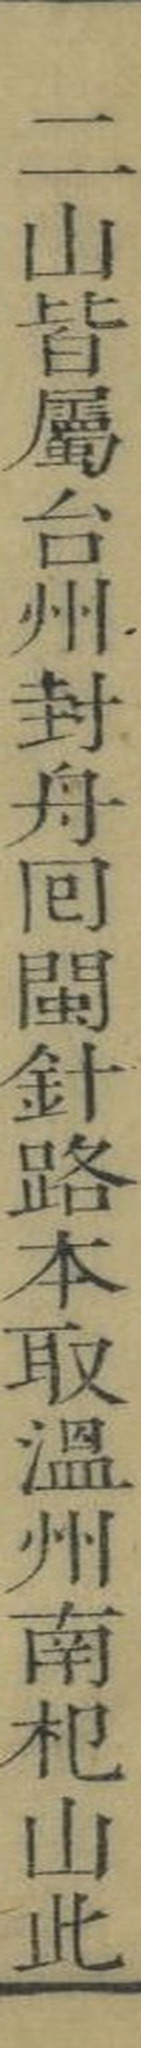二山皆屬台州封舟囘閩針路本取溫州南杞山此
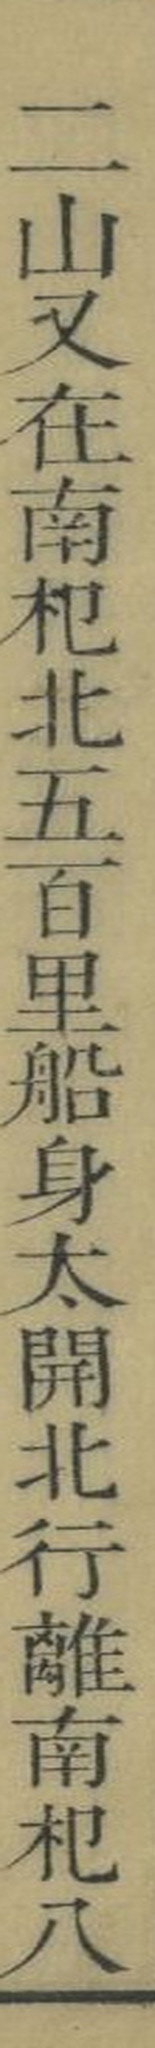二山又在南杞北五百里船身太開北行離南杞八
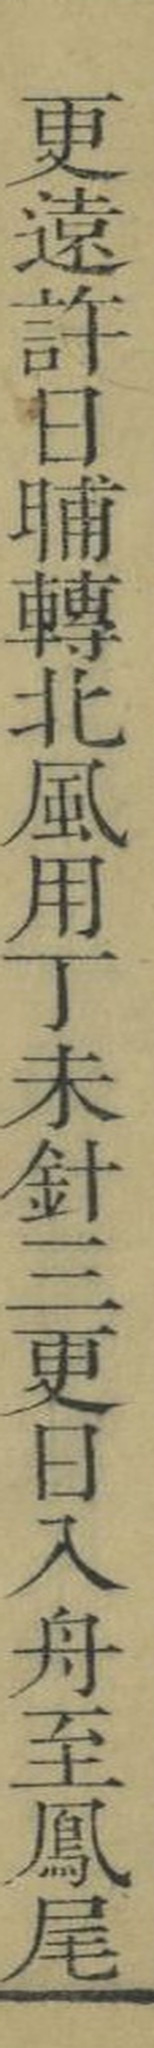更遠許日晡轉北風用丁未針三更日入舟至鳳尾
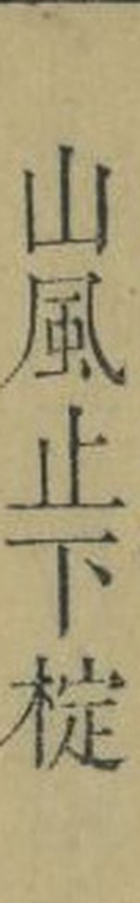山風止下椗
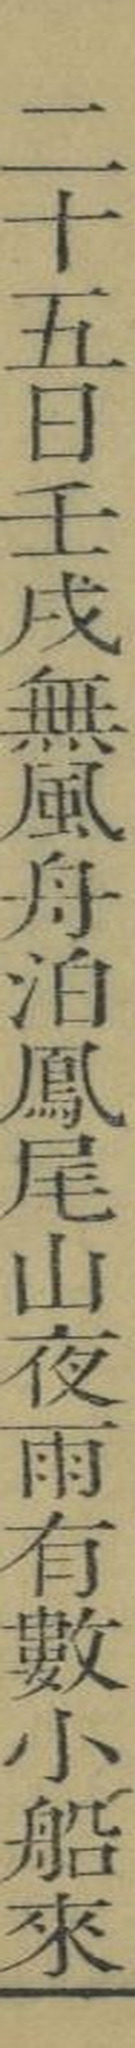二十五日壬戌無風舟泊鳳尾山夜雨有數小船來
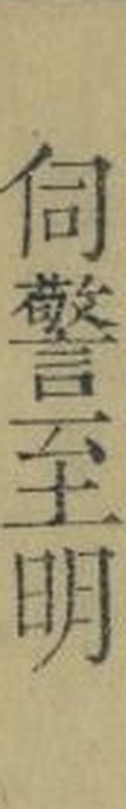伺警至明
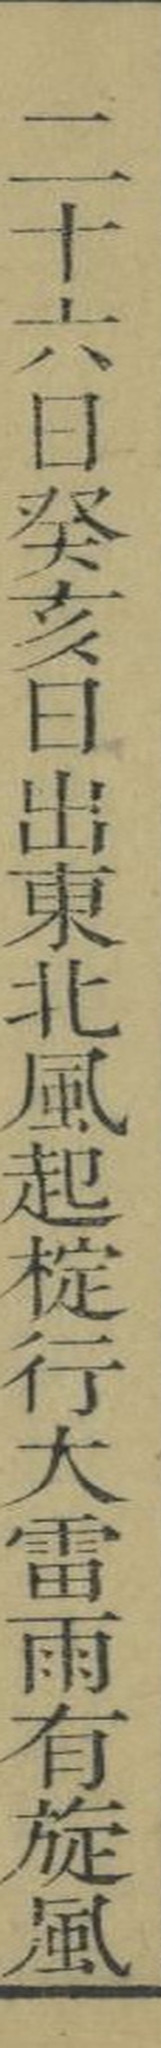二十六日癸亥日出東北風起椗行大雷雨有旋風
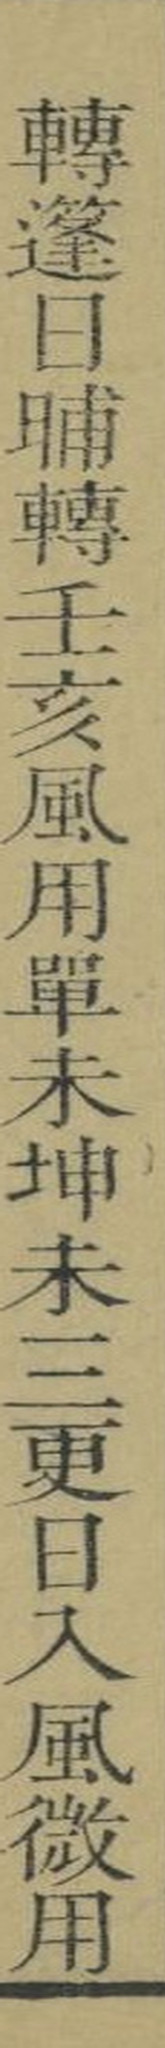轉篷日晡轉壬亥風用單未坤未三更日入風微用
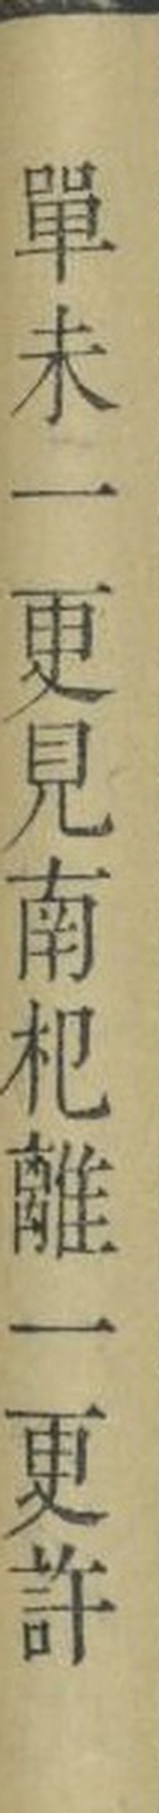單未一更見南杞離一更許
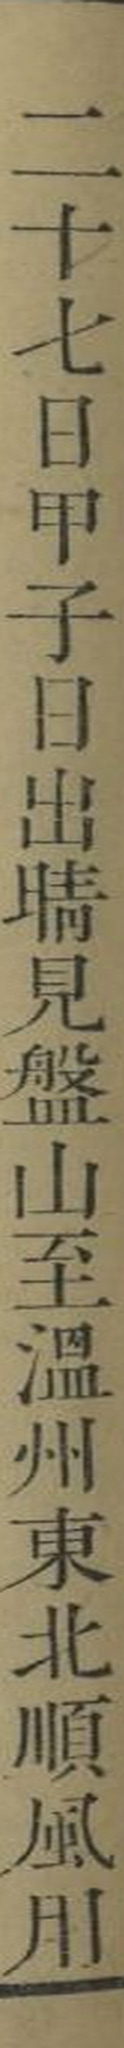二十七日甲子日出晴見盤山至溫州東北順風用
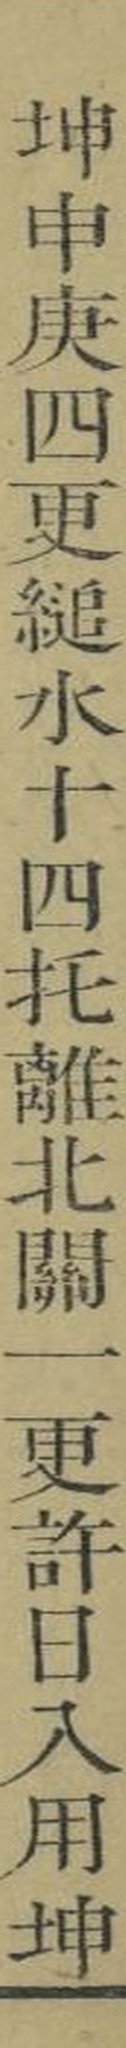坤申庚四更縋水十四托離北關一更許日入用坤
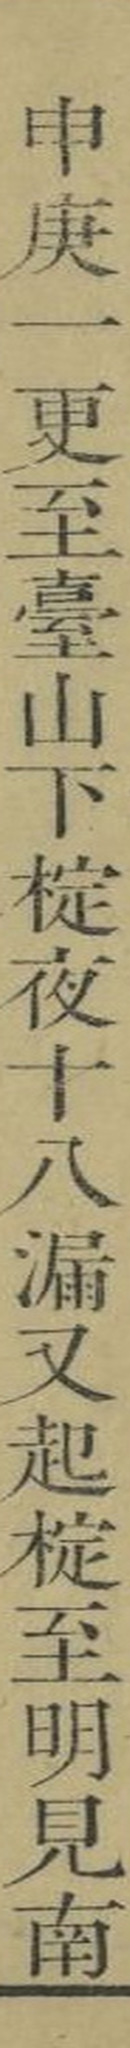申庚一更至臺山下椗夜十八漏又起椗至明見南
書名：中山伝信録 巻一
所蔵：University of the Ryukyus Library
